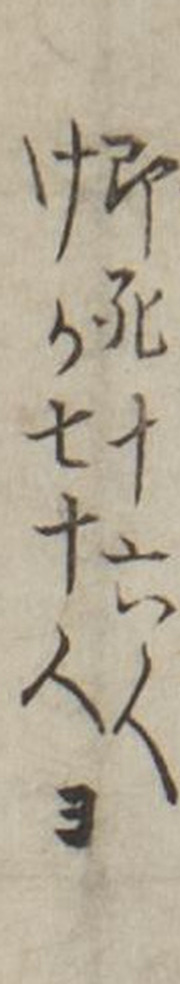即死十六人
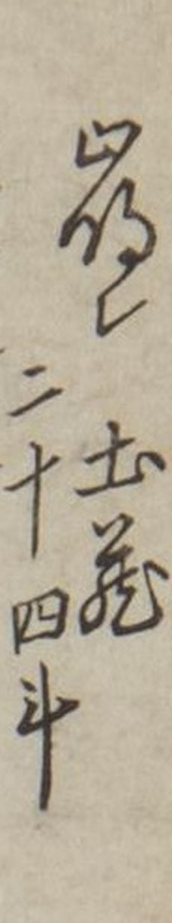崩れ土蔵
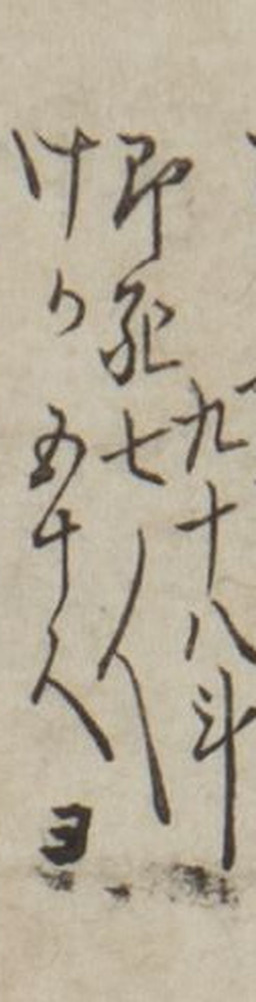けか五十人よ
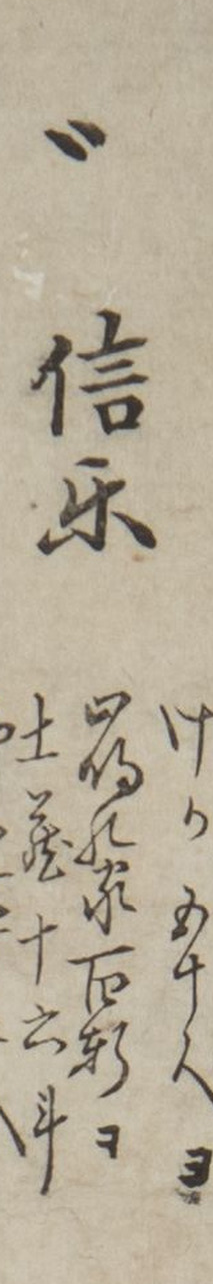〃信楽崩れ家百件よ
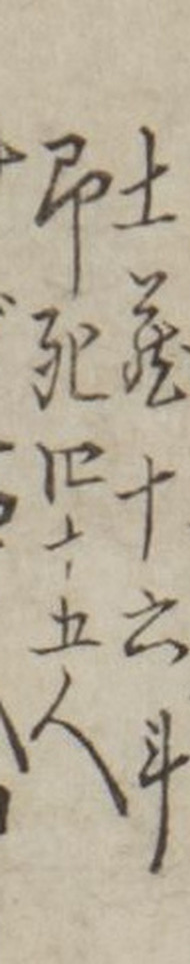即死四十五人
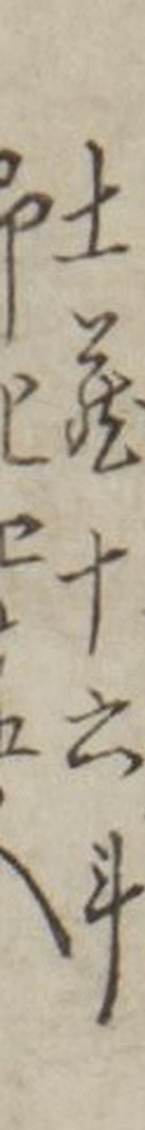土蔵十六計
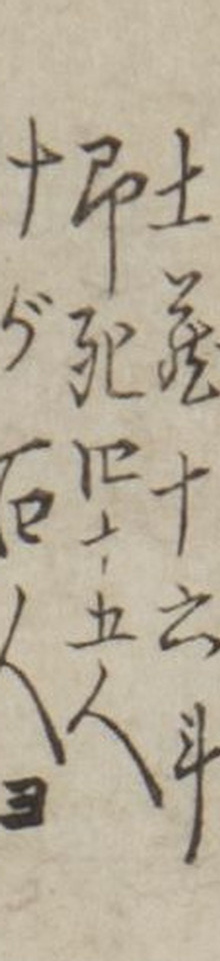即死四十五人
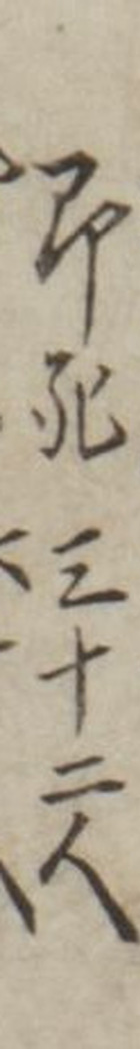即死三十二人
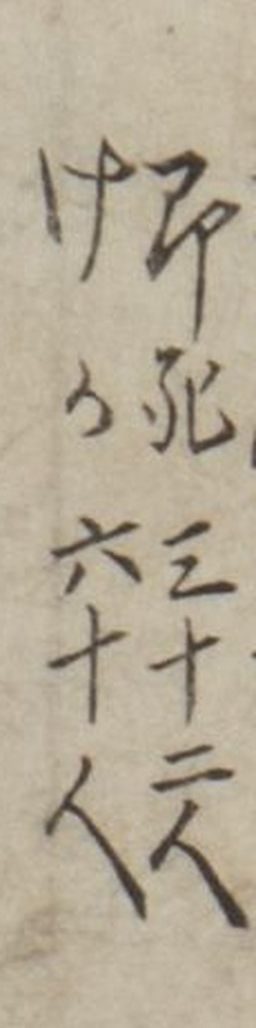けか六十人
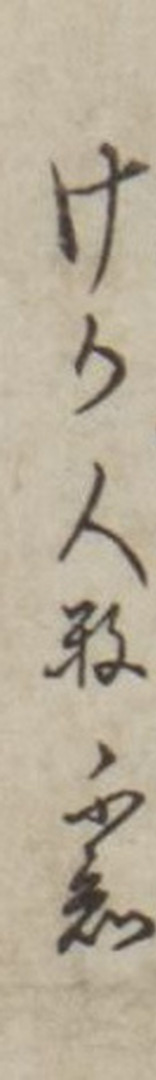けが人数不知
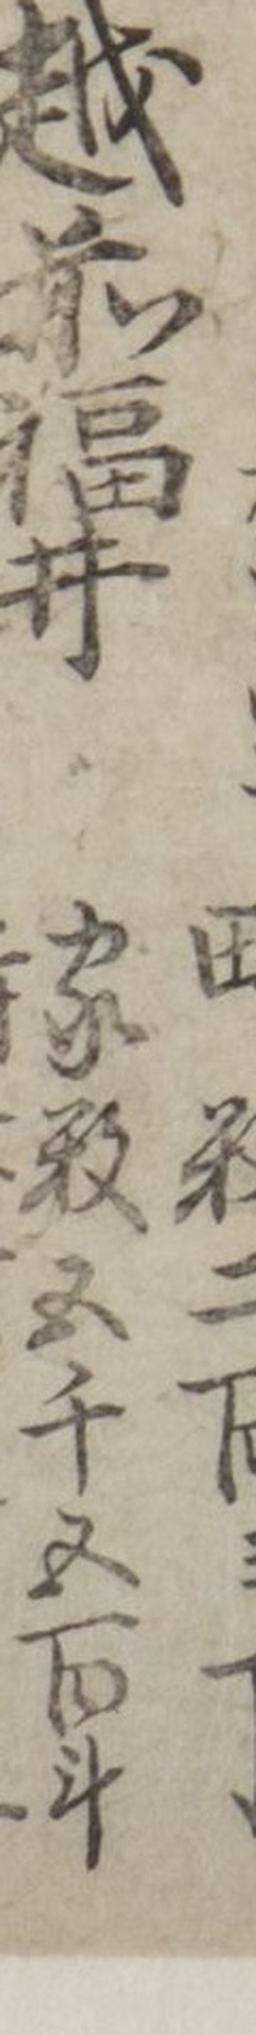越前福井家数五千五百計
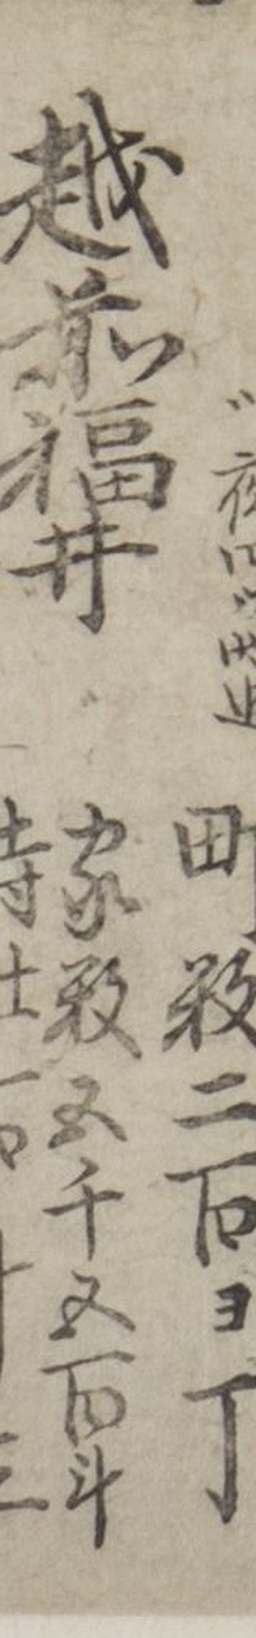越前福井家数五千五百計
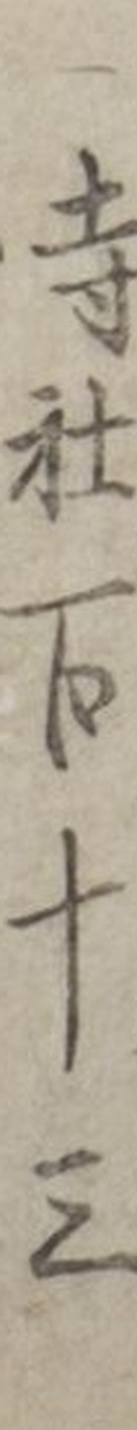大火寺社百十三
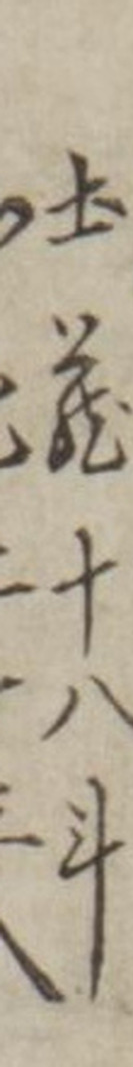土蔵十八計
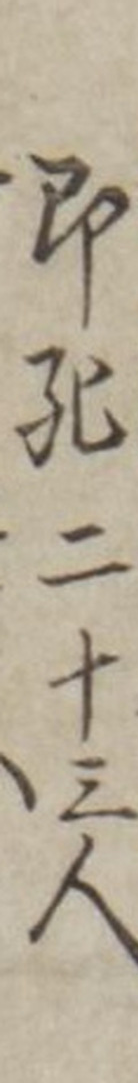即死二十三人
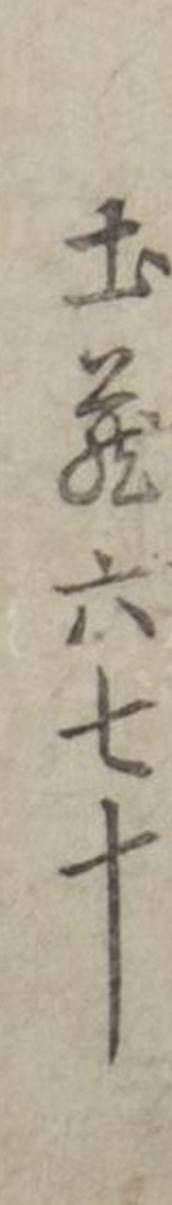土蔵六七十
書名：嘉永七寅年大地震記
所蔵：あいおいニッセイ同和損保株式会社
